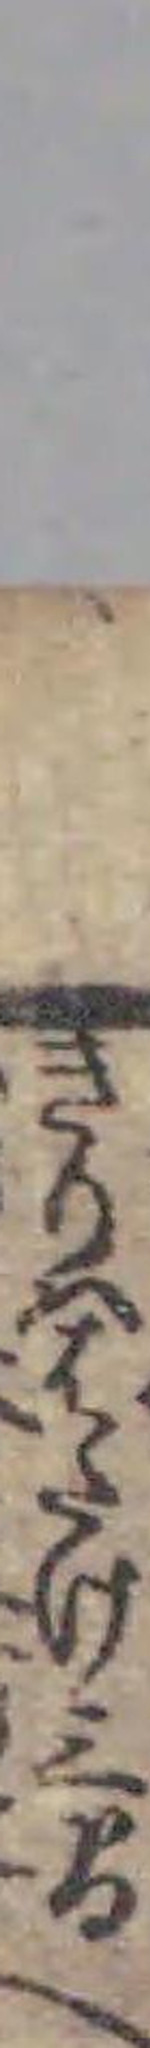きりははたけ三間
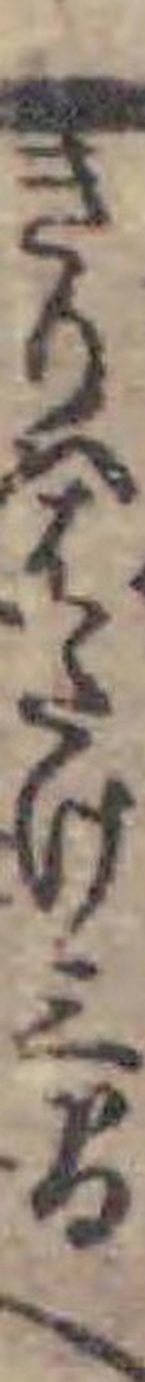きりははたけ三間
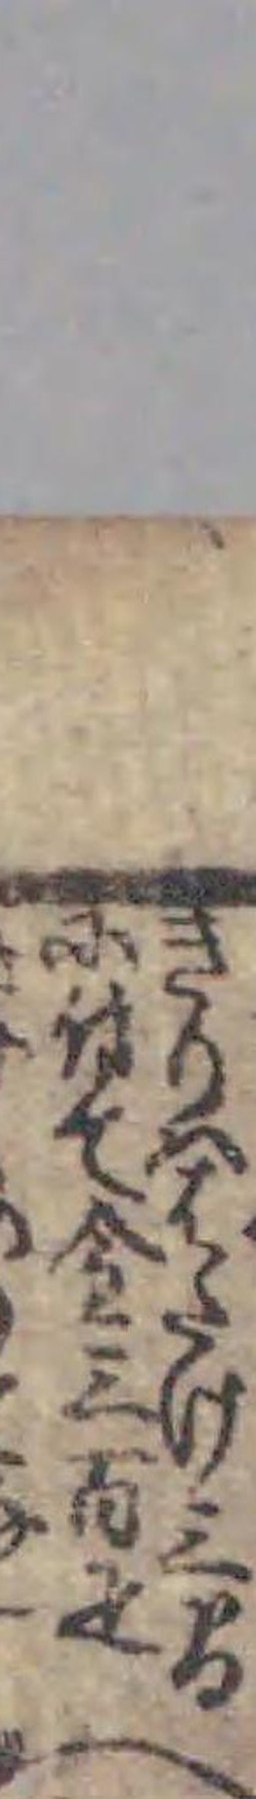に付て金三百疋
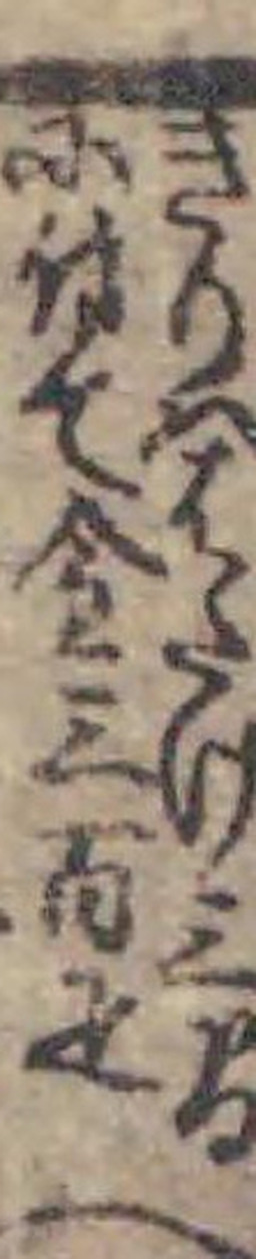に付て金三百疋
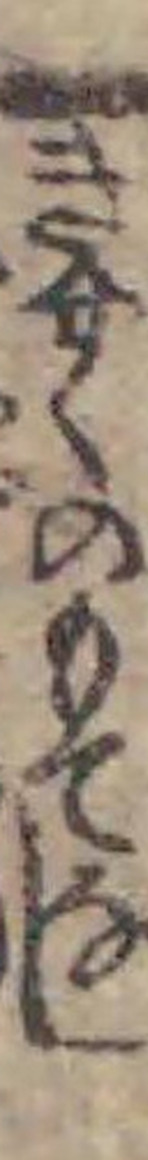きやくのもてなし
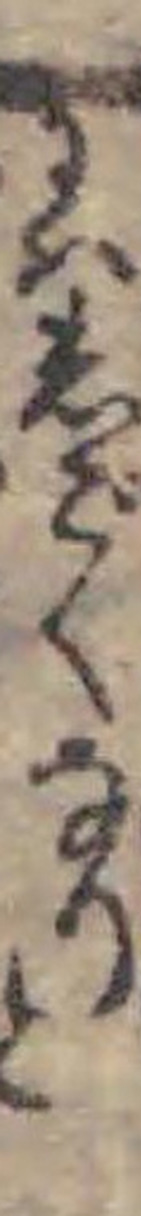にはしごくなりと
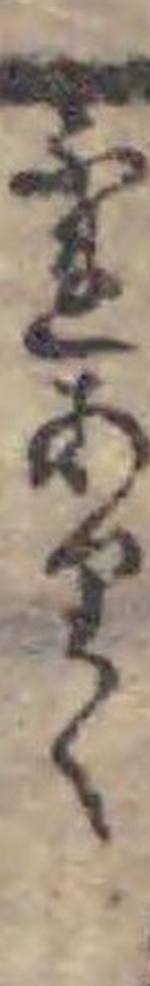ふれありく
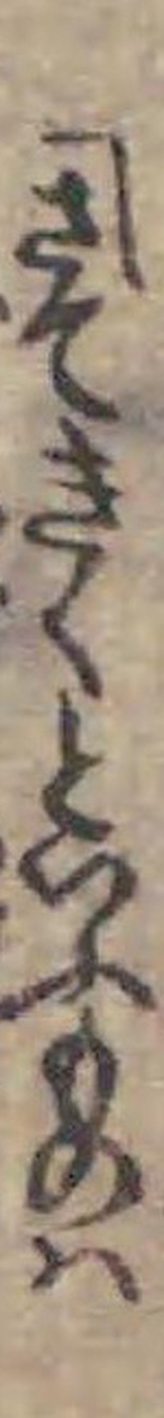〽さてきくといふものは
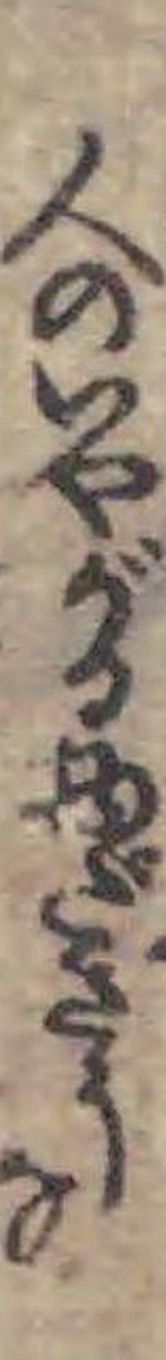ひとのいやがる物ださうな
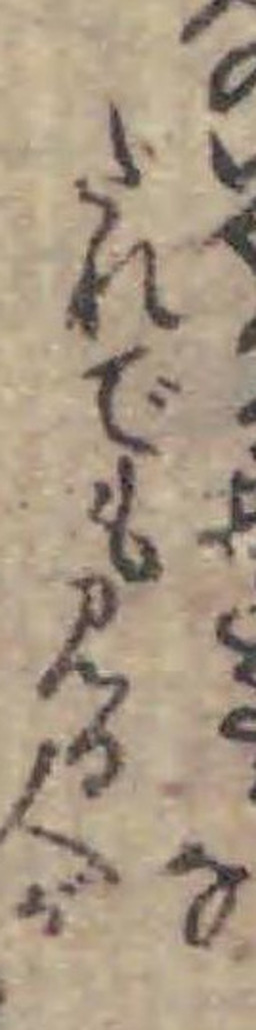だれでも見る人が
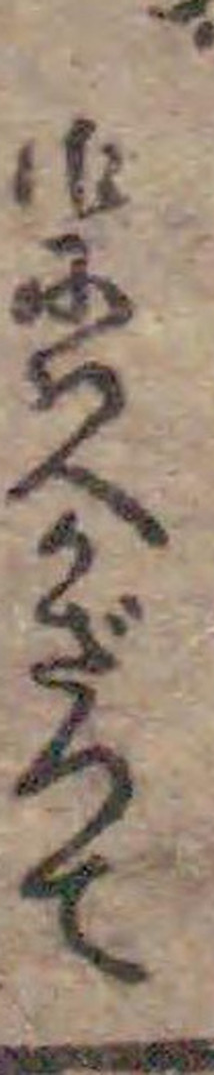御にはへかざつて
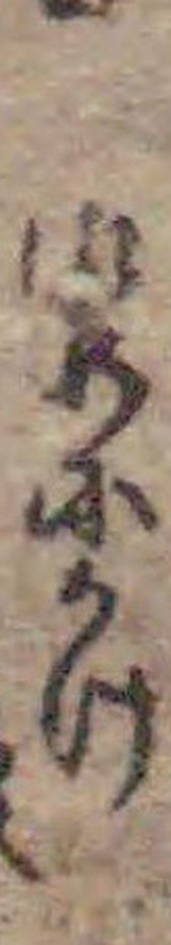御めにかけ

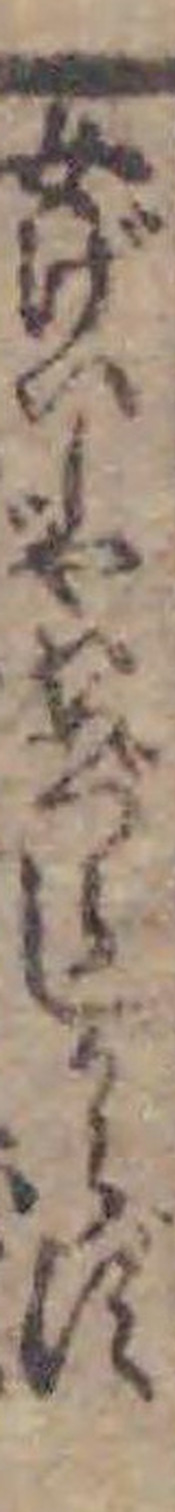女げいしやはめづらしからず
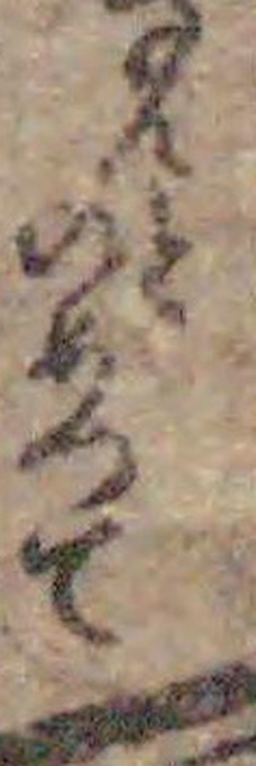のめつて
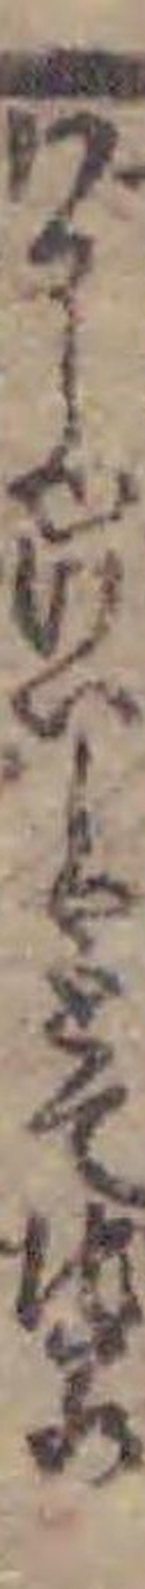わかしゆげいしやとて地若
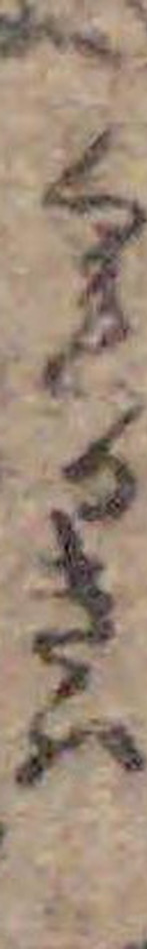くれるきは
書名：本樹真猿浮気噺 : 3巻
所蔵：国立国会図書館 National Diet Library, JAPAN
